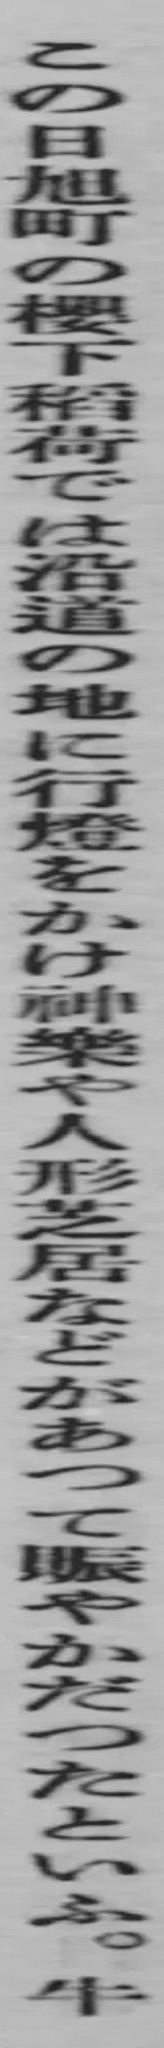この日旭町の櫻下稻荷では沿道の地に行燈をかけ神樂や人形芝居などがあつて賑やかだつたといふ。牛
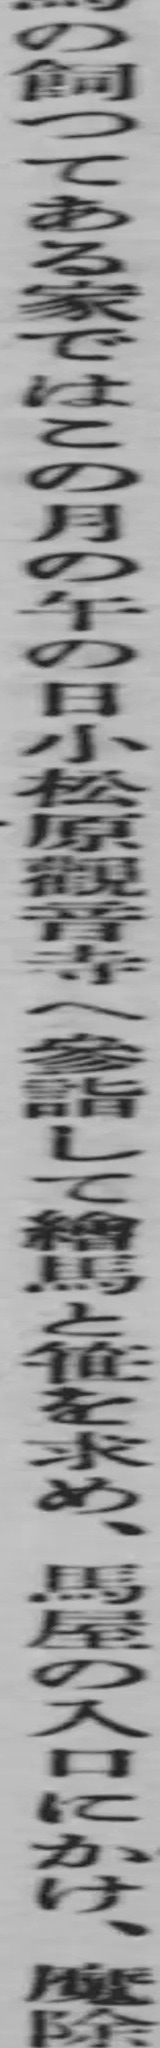馬を飼つてある家ではこの月の午の日小松原觀音寺へ參詣して繪馬と笹を求め、馬屋の入口にかけ、魔除
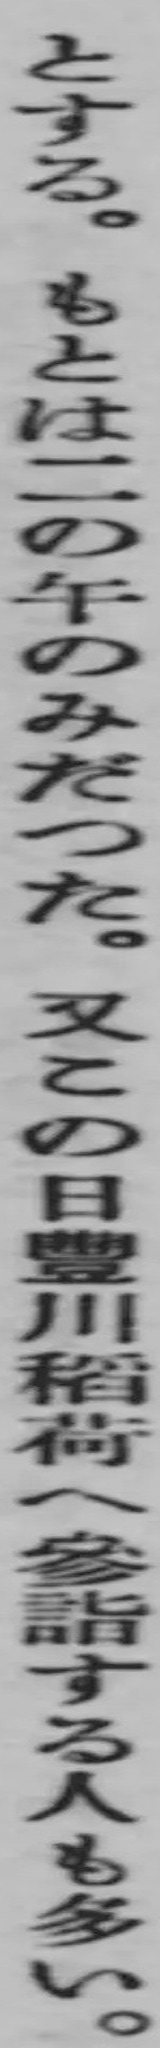とする。もとは二の午のみだつた。又この日豐川稻荷へ參詣する人も多い。
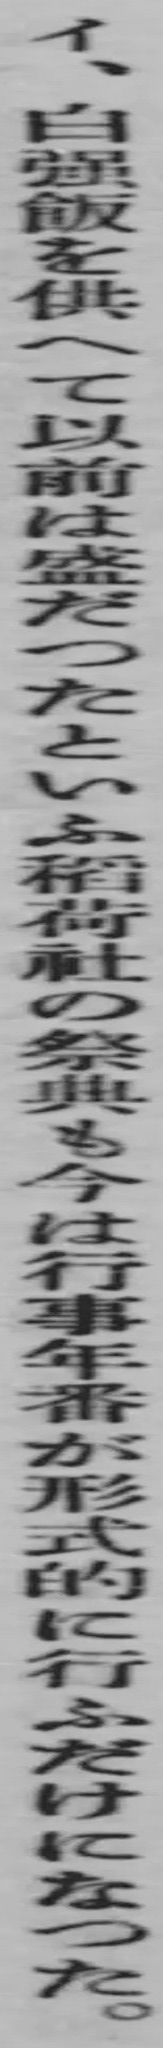イ、白强飯を供へて以前は盛だつたといふ稻荷社の祭典も今は行事年番が形式的に行ふだけになつた。
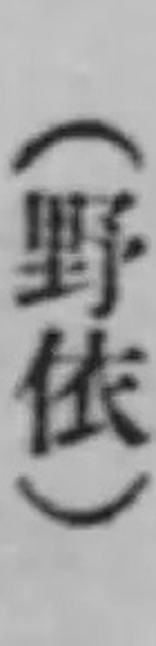(野依)
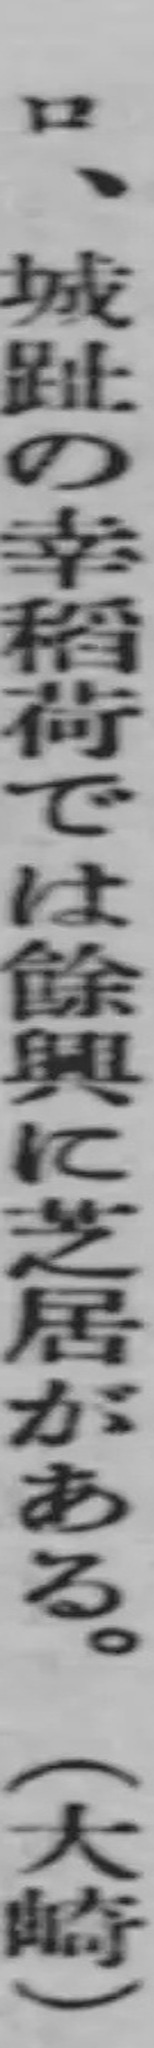ロ、城趾の幸稻荷では餘興に芝居がある。(大崎)
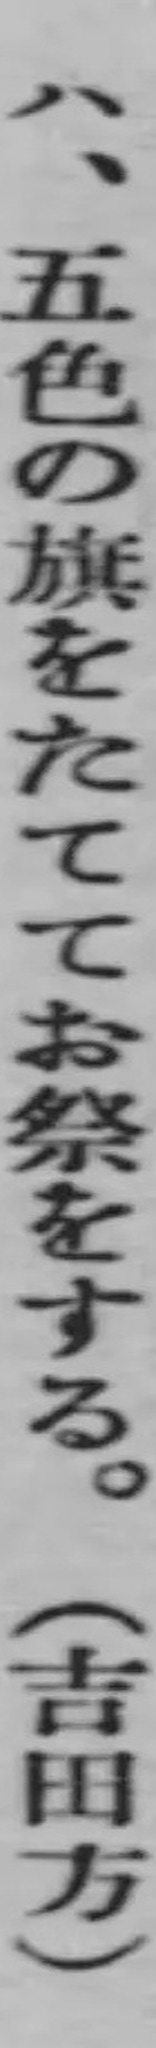ハ、五色の旗をたててお祭をする(吉田方)
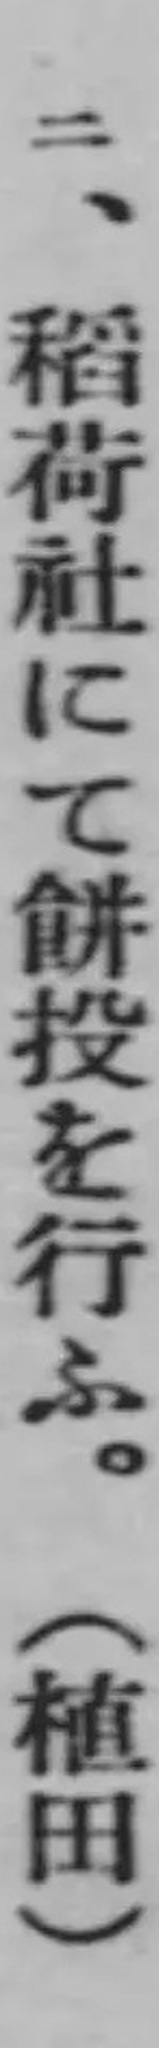ニ、稻荷社にて餅投を行ふ。(植田)
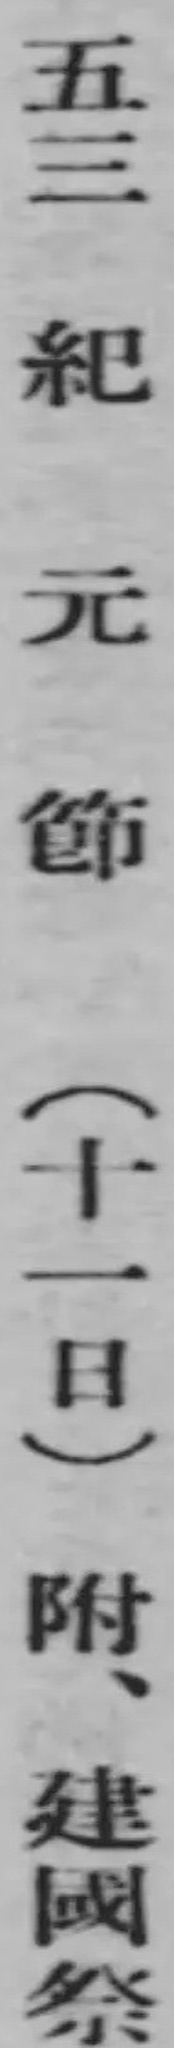五三紀元節(十一日)附、建國祭
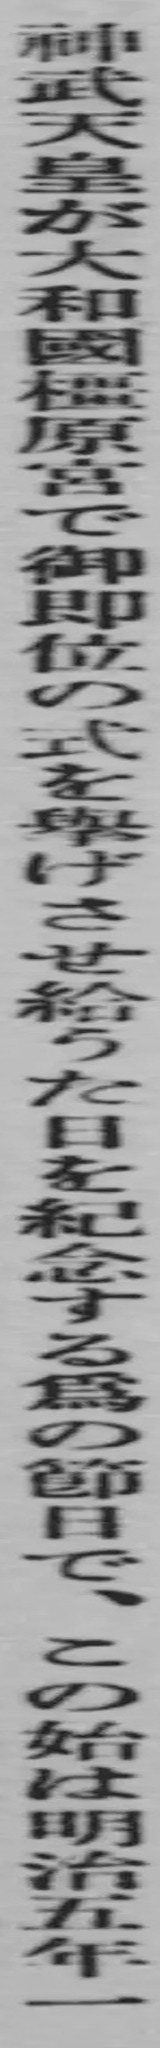神武天皇が大和國橿原宮で御即位の式を擧げさせ給うた日を紀念する爲の節日で、この始は明治五年一
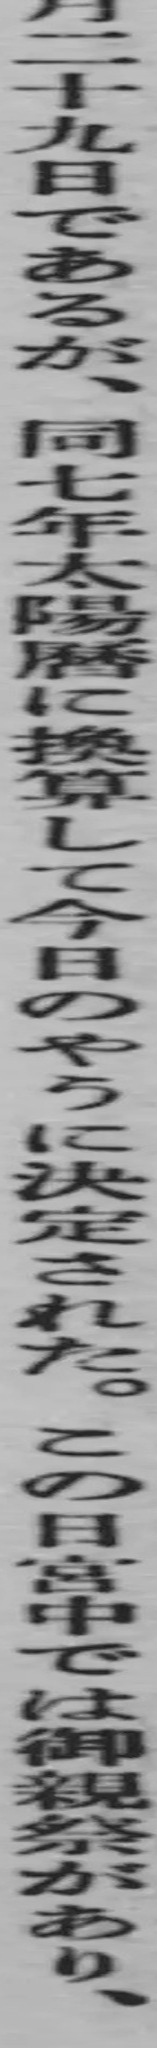月二十九日であるが、同七年太陽曆に換算して今日のやうに決定された。この日宮中では御親祭があり、
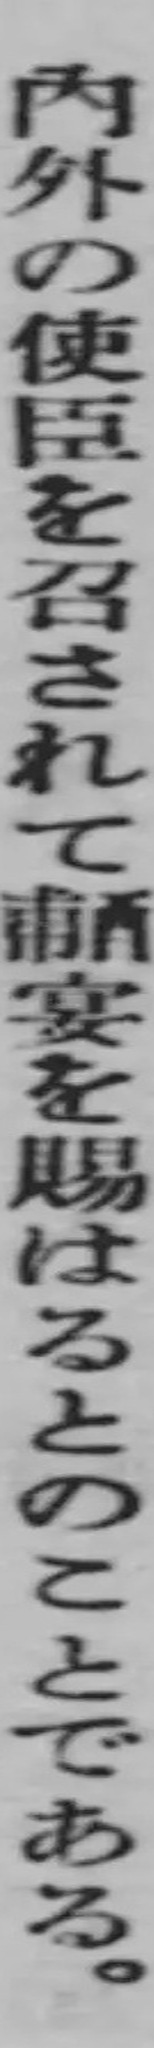内外の使臣を召されて宴を賜はるとのことである。
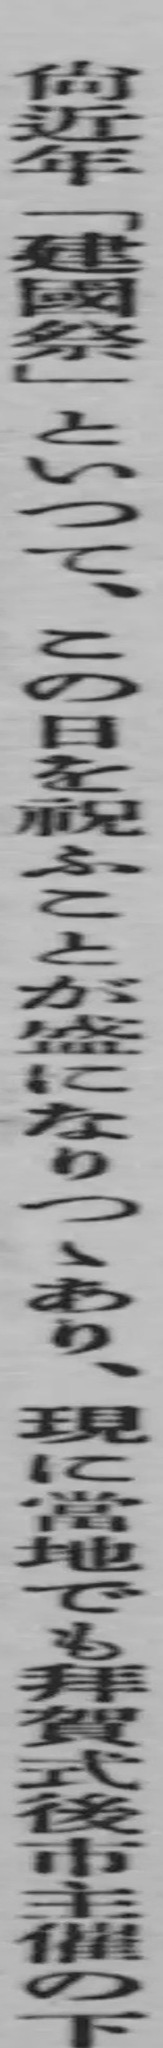尚近年「建國祭」といつて、この日を祝ふことが盛になりつゝあり、現に當地でも拜賀式後市主催の下
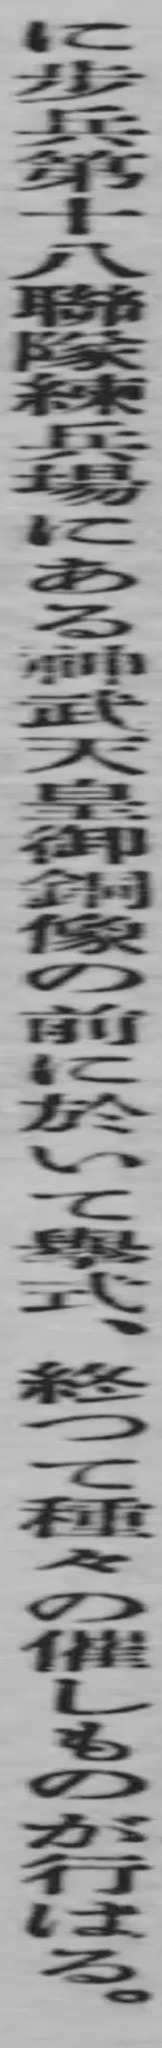に歩兵第十八聯隊練兵場にある神武天皇御銅像の前に於いて擧式、終つて種々の催しものが行はる。
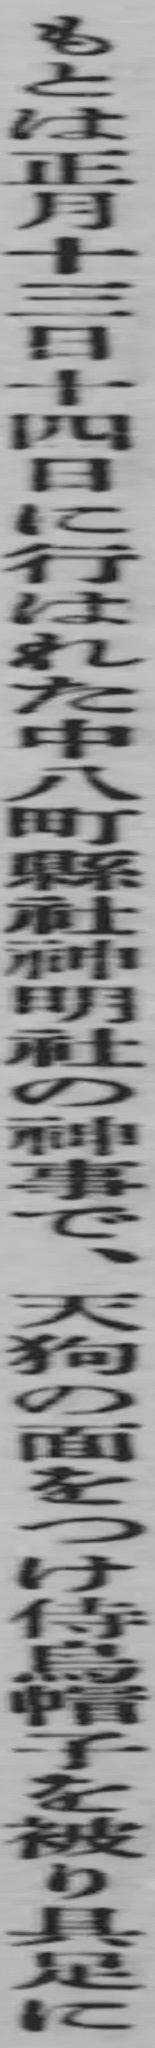もとは正月十三日十四日に行はれた中八町縣社神明社の神事で、天狗の面をつけ侍烏帽子を被り具足に
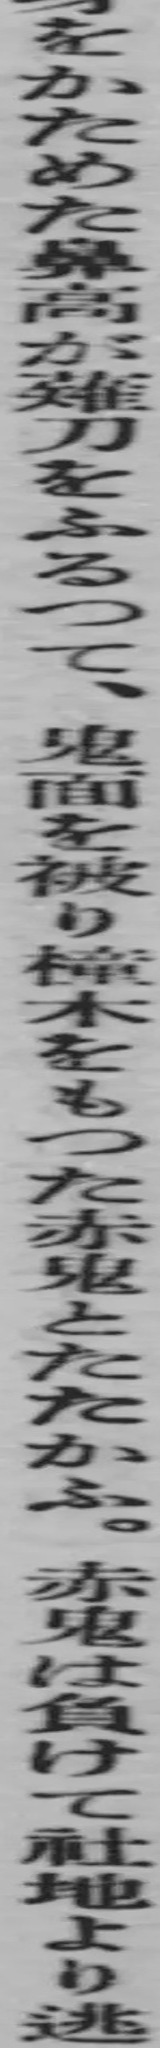身をかためた鼻高が薙刀をふるつて、鬼面を被り橦木をもつた赤鬼とたたかふ。赤鬼は負けて社地より逃
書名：豊橋の年中行事
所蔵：国立国会図書館 National Diet Library, JAPAN
